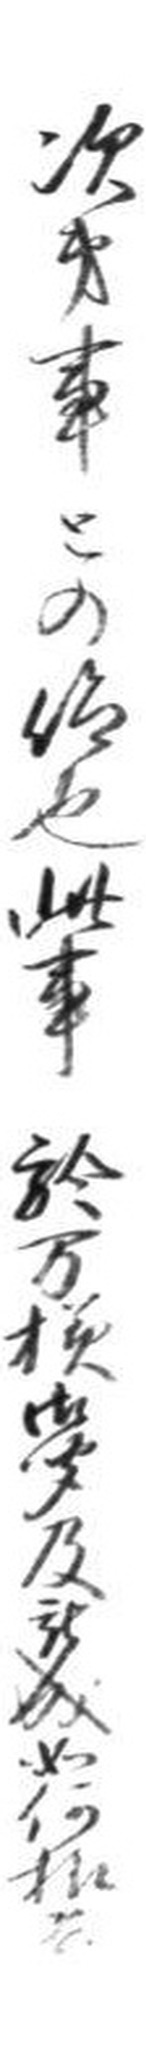次第事との仰也此事於万様御聞及被成如何様共
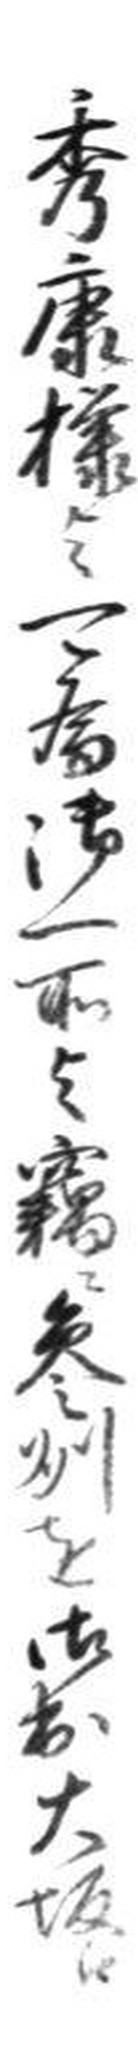秀康様与可為御一所与竊ニ参州を御出大坂江
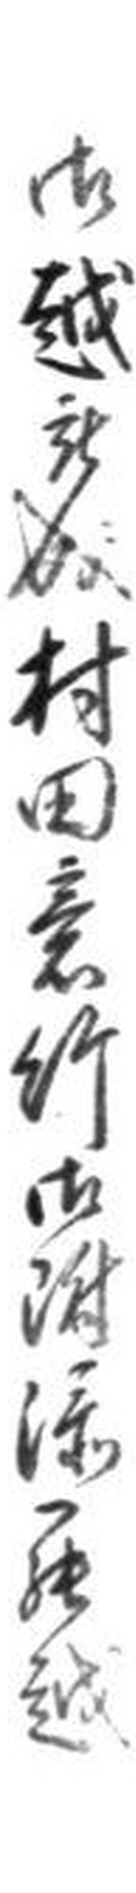御越被成村田意竹御附添罷越
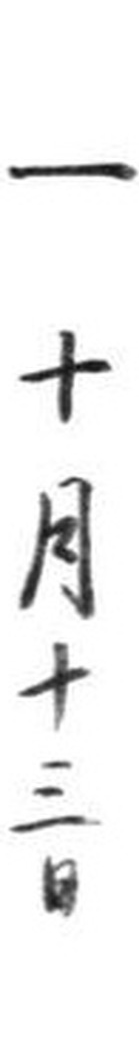一十月十三日
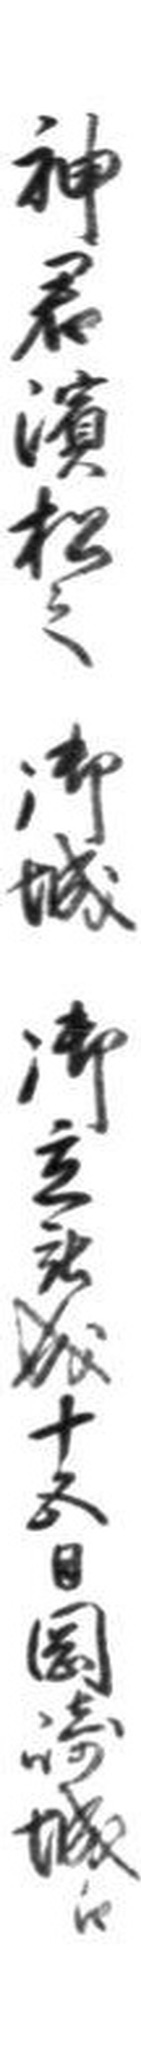神君浜松之御城御立被成十五日岡崎城江
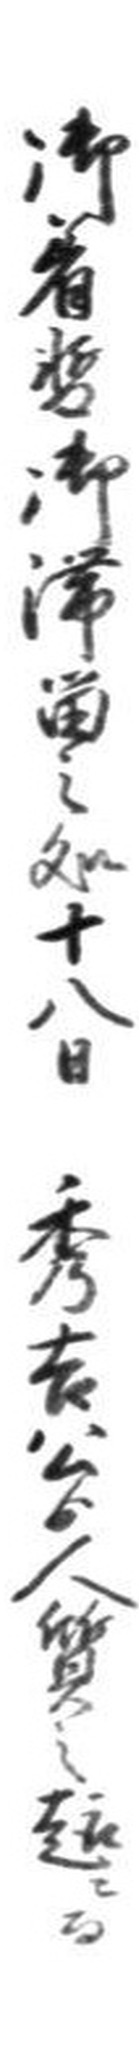御着暫御滞留之処十八日秀吉公ゟ人質之趣ニ而
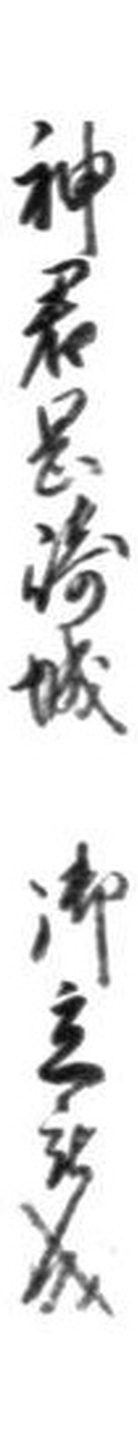神君岡崎城御立被成
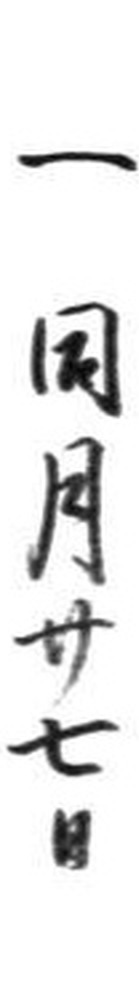一同月廿七日
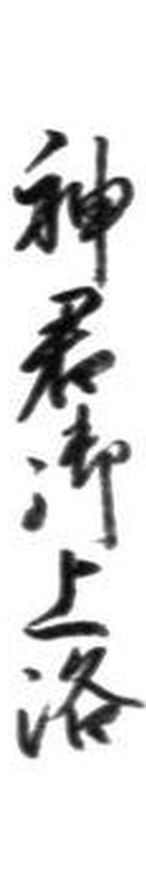神君御上洛
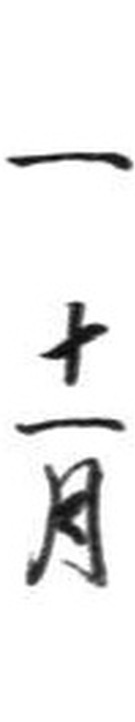一十一月
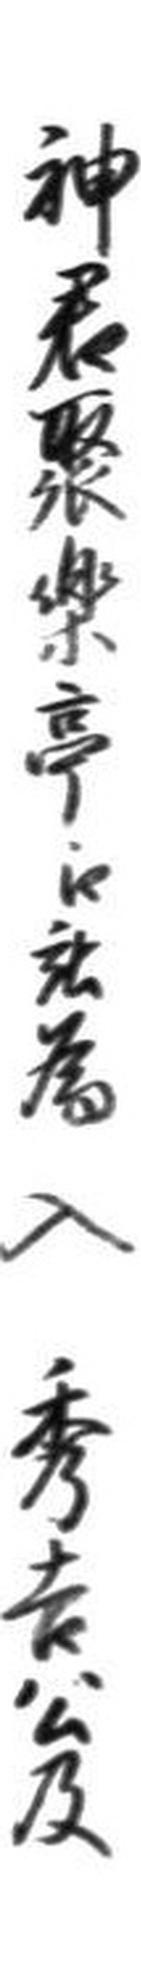神君聚楽亭江被為入秀吉公及
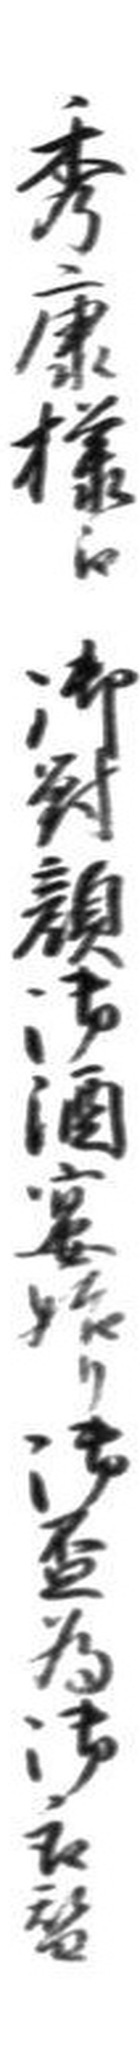秀康様御対顔御酒宴始り御盃為御取替
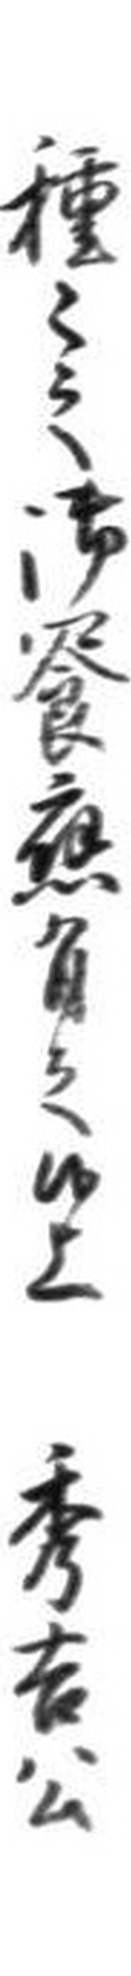種々之御饗応有之候上秀吉公
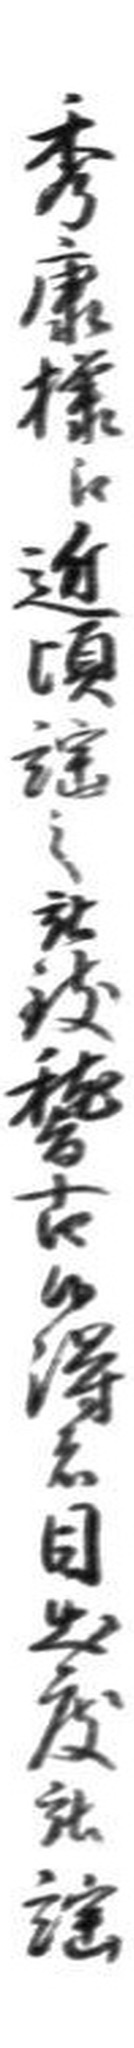秀康様江近頃謡之被致稽古候得者目出度被謡
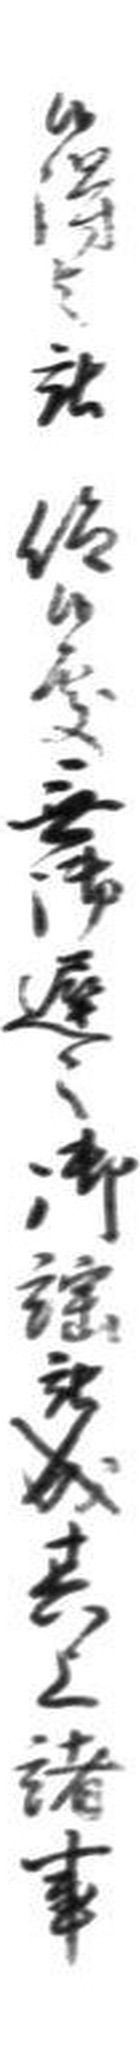候得与被仰候処無御遅々御謡被成其上諸事
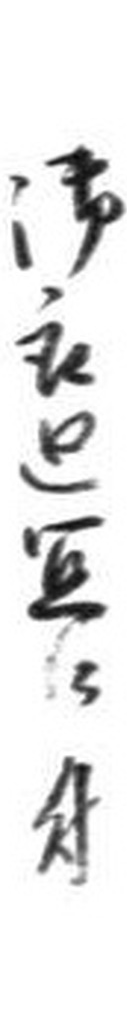御取廻宜ニ付
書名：家譜 一 秀康公 従天正二年到慶長十二年
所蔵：福井県文書館 Fukui Prefectural Archives
